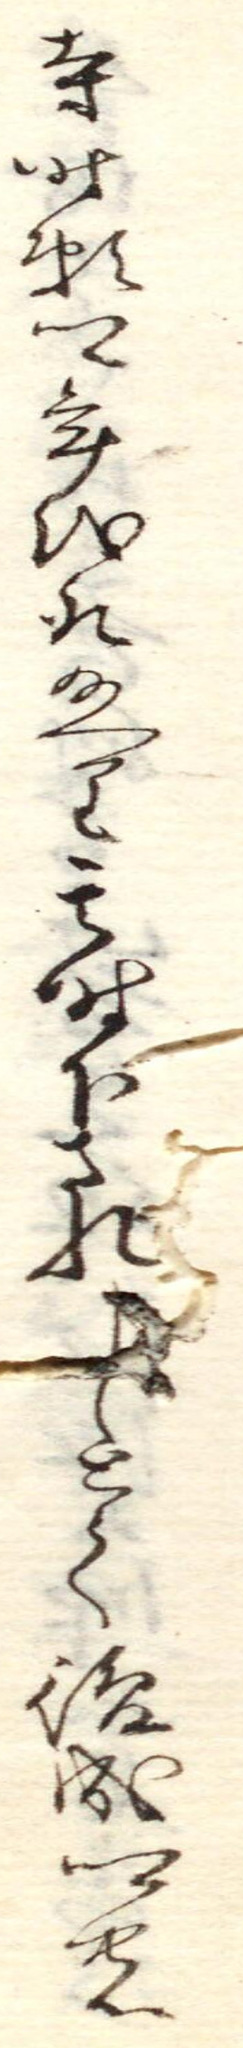寺時頼卿年を取給へり其時下されしとて俊成卿の
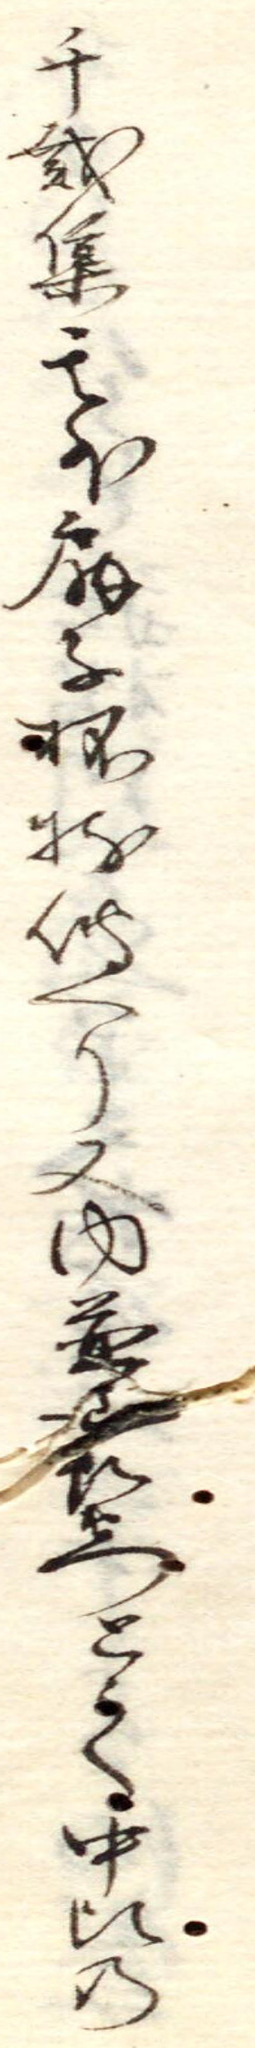千載集其外扇子抔持伝へり又内並左衛門とて中頃の
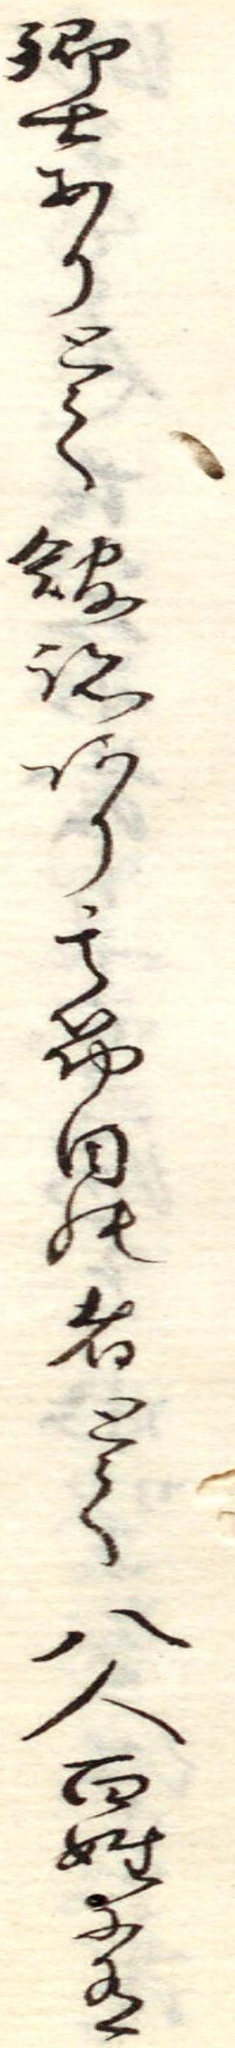郷士ありとて館跡あり其筋目の者とて八人百姓に有
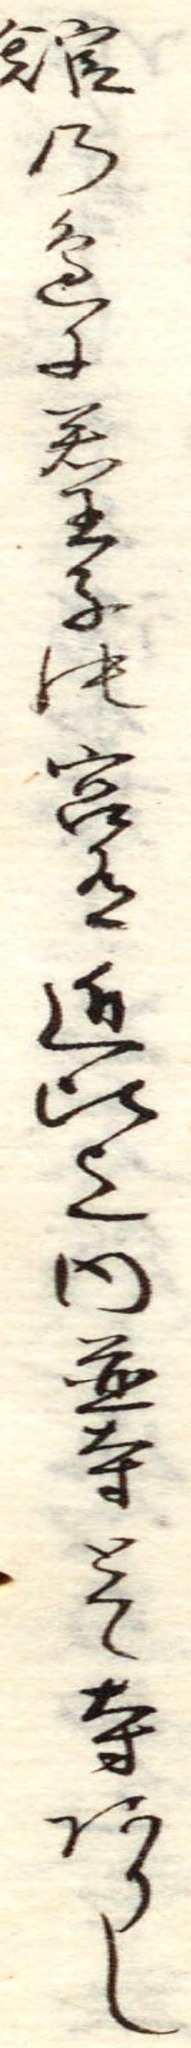館の辺に若王子の宮有近頃迄内並寺とて寺ありし
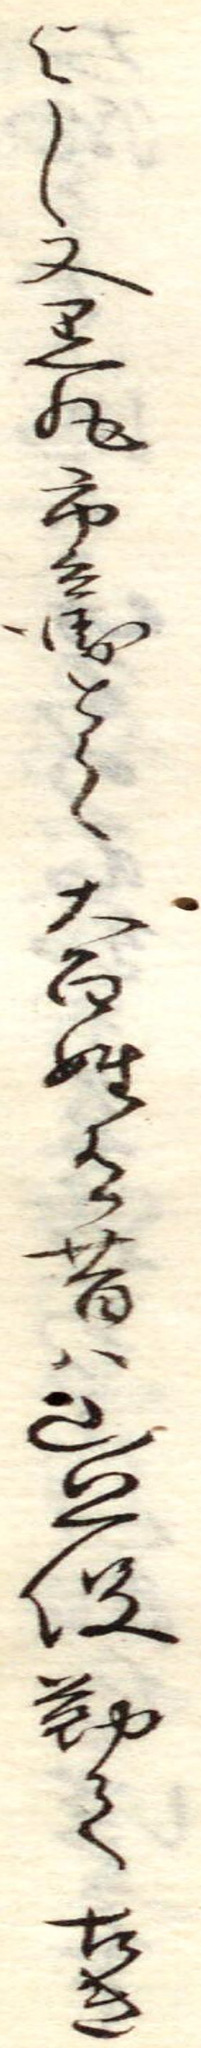よし又黒丸市兵衛とて大百姓有昔は山廻役勤之古き
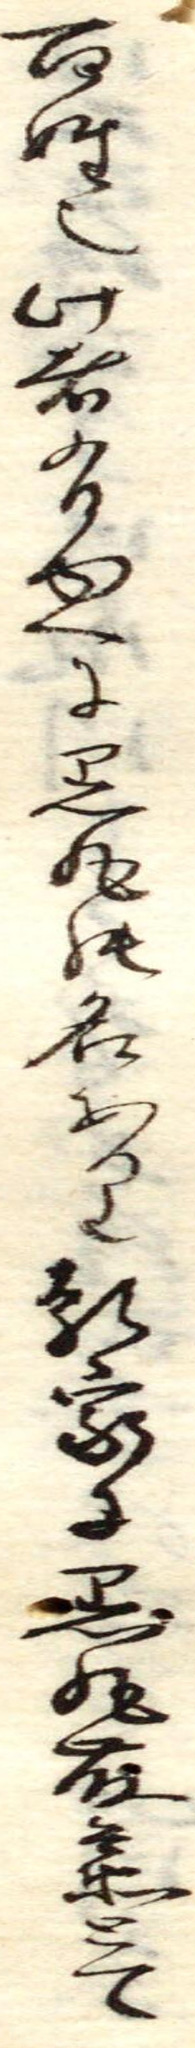百姓也此者有ゆへに黒丸の名あり類家に黒丸藤兵衛とて

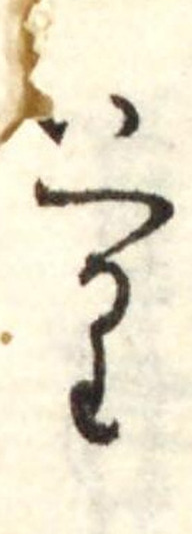いへり
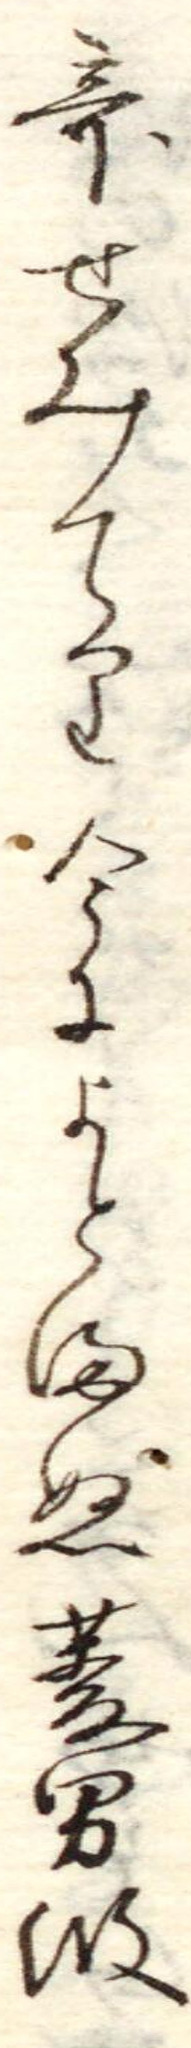寄せみてり今によとまぬ菱男波
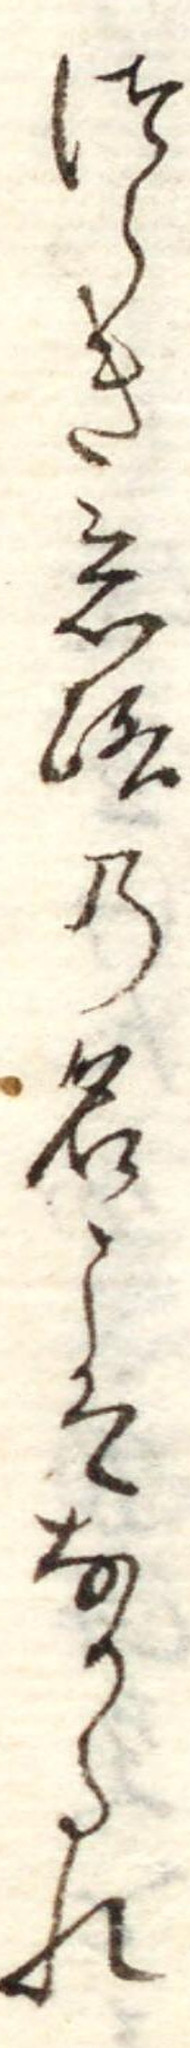つらき恋路の名こそなかるれ
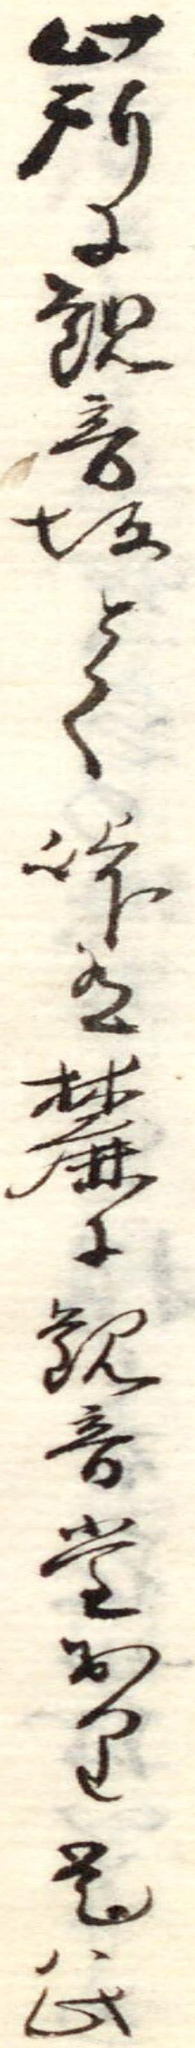此所に観音坂とて峠有麓に観音堂あり是は此
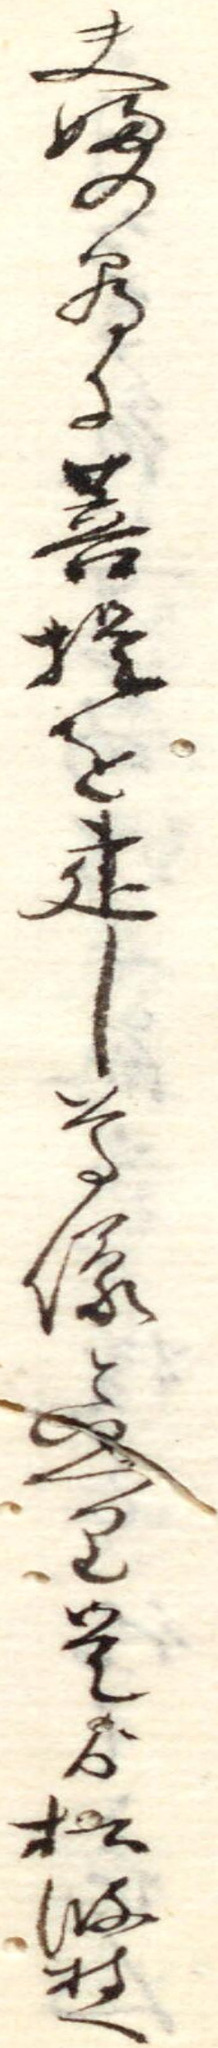夫婦の為に菩提を建し尊像といへり是ゟ松波村へ
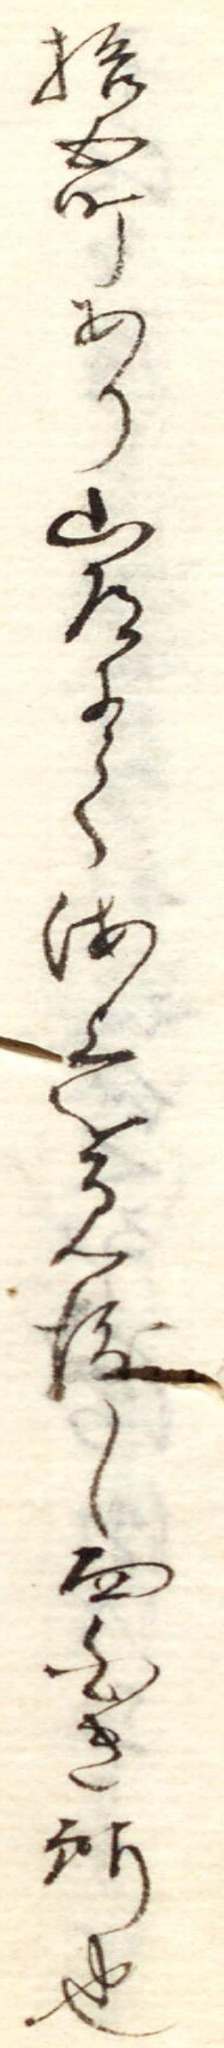拾五丁あり山道にて海上を見渡し面白き所也
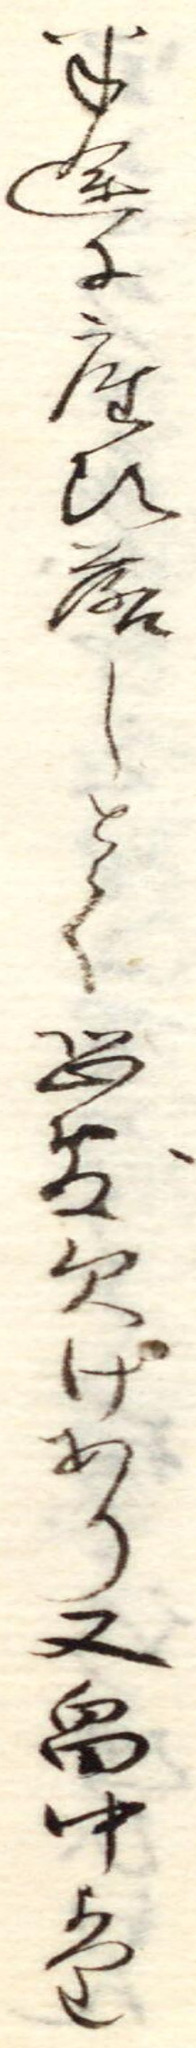半途に座頭落しとて恐敷欠けあり又畠中より
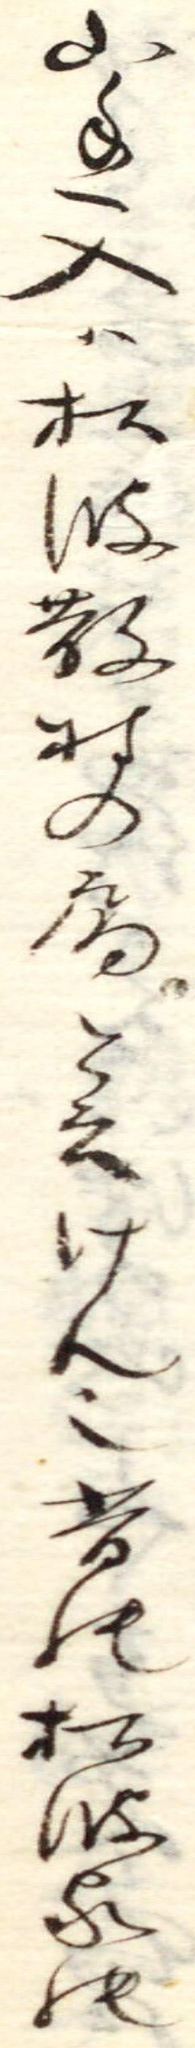山手へ入は松波散村の為と云けん也昔の松波家の
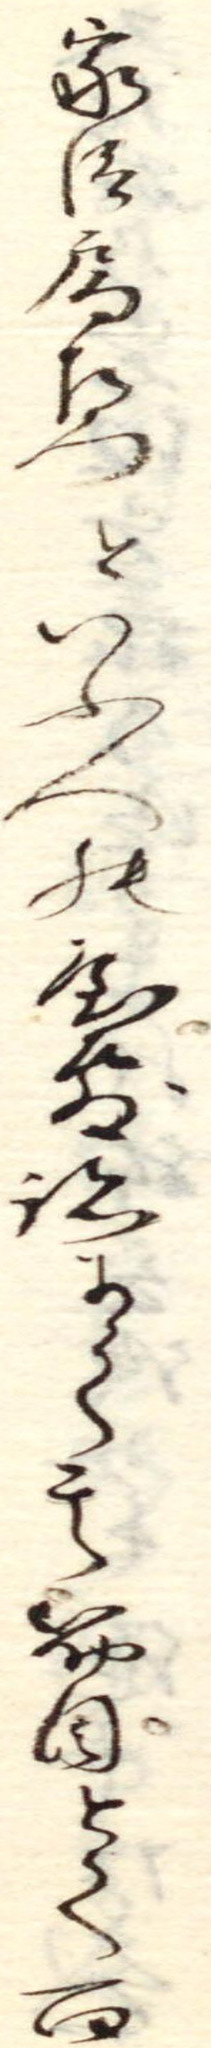家臣為左衛門といふ人の屋敷跡其筋目とて百
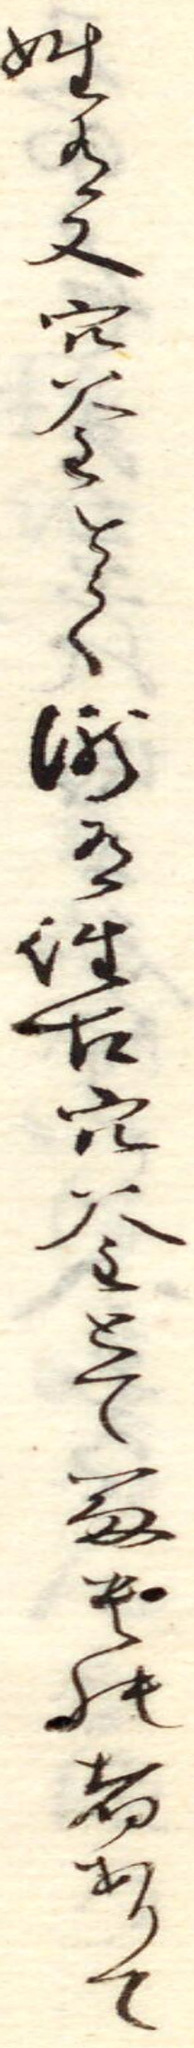姓有又穴釜とて瀧有往古穴釜とて富貴の者ありて
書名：能登名跡誌
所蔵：Ishikawa Prefectural Library
